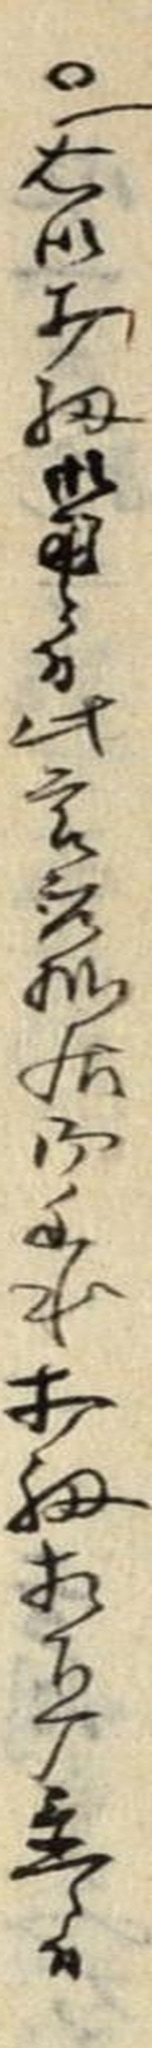○右御打剱御用に付此節取掛居御手本打剱相下ケ置候付
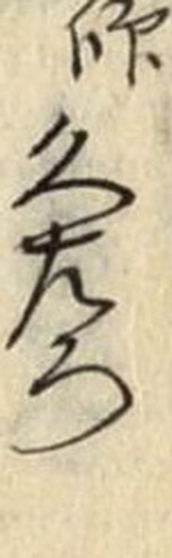久左衛門
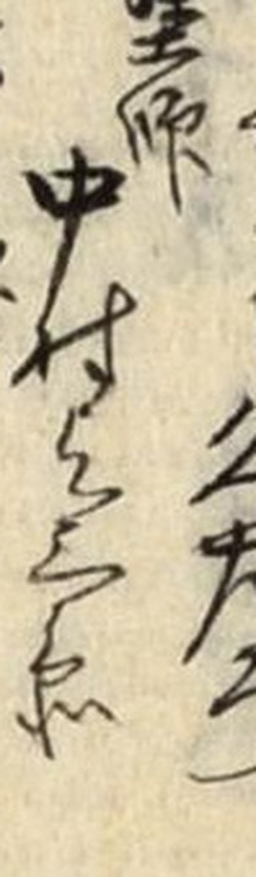中村与三兵衛
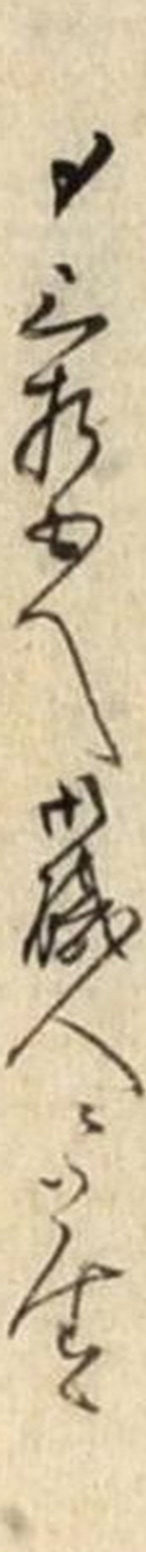〆三拾五人御職人に御座候
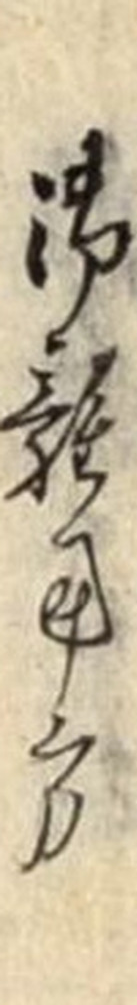御雑用方

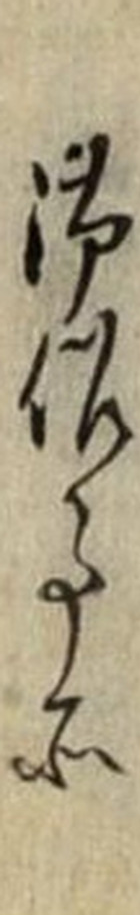御作事所
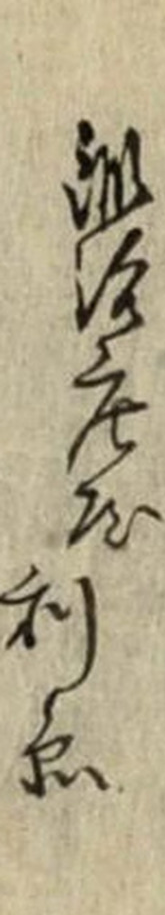提一鍛冶庄屋利兵衛
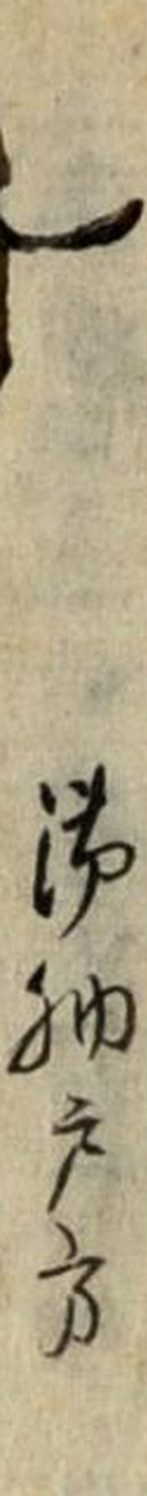御納戸方
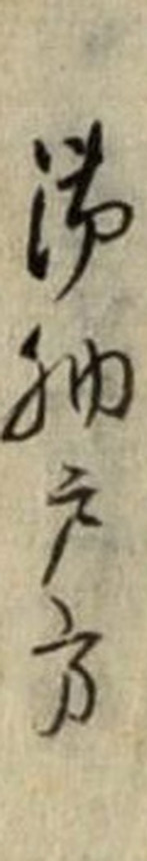御納戸方
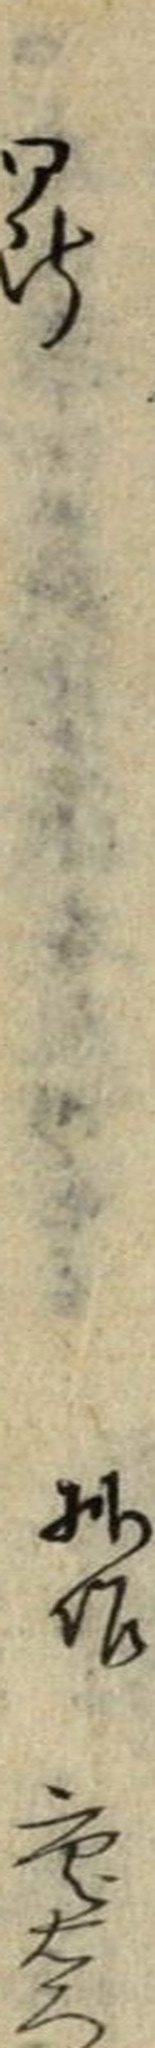同断掛作市右衛門
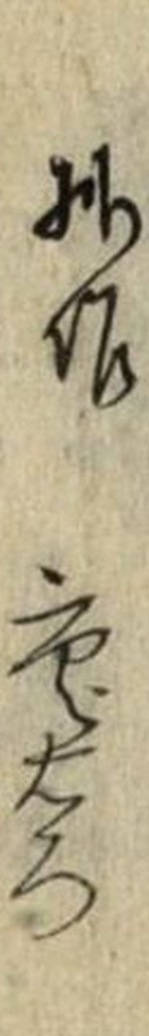同断掛作市右衛門
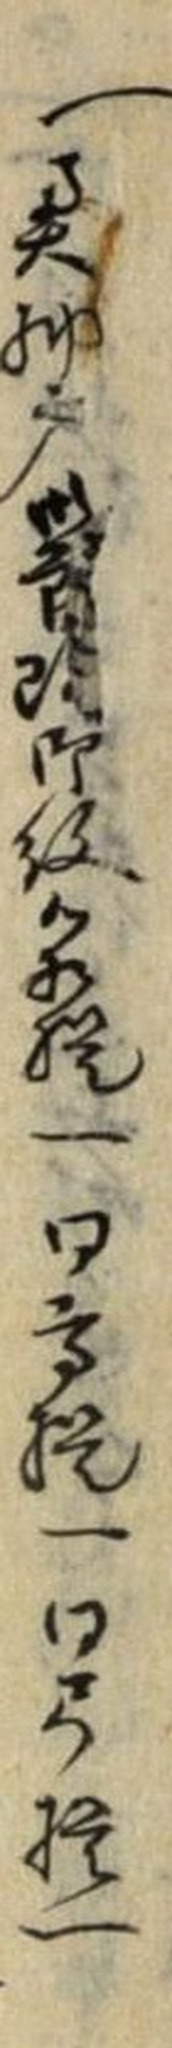奥納戸御用改御紋箱提一同高提一同弓提一
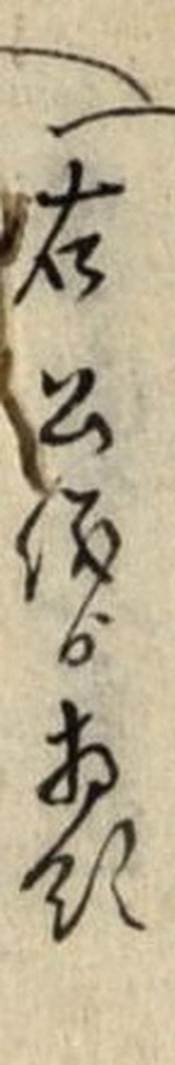右公儀ゟ拝領
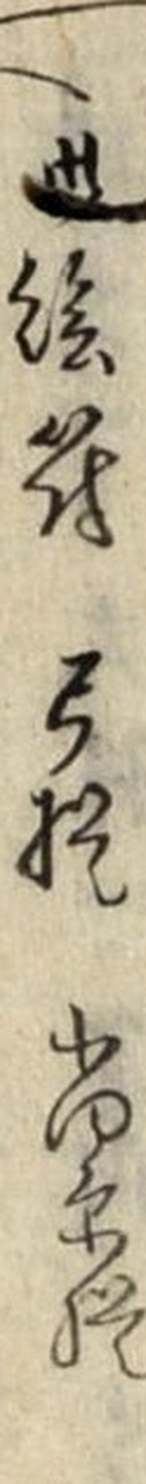御絵符弓提小田原提
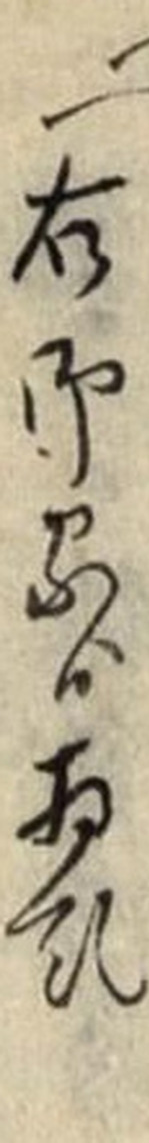右御家ゟ拝領
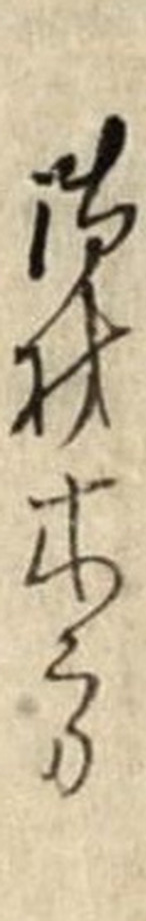御材木方
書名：蒐輯之部
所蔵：福井県文書館 Fukui Prefectural Archives
